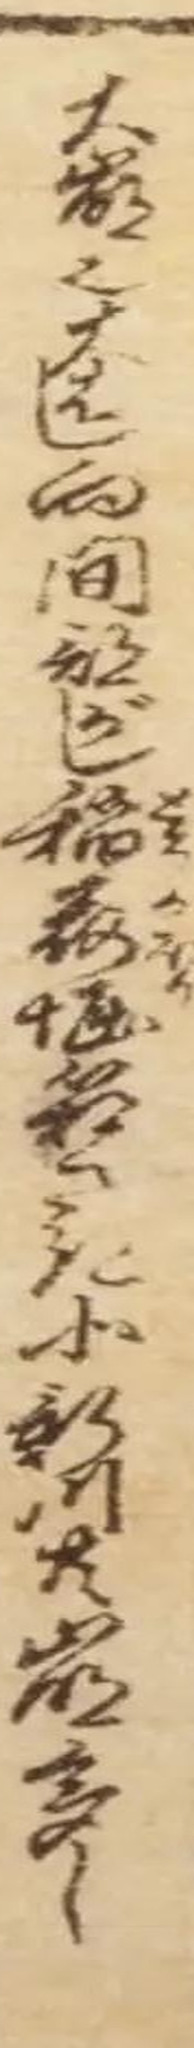大崩也大はし向間部がし稲荷堀箱さき北新川共崩多し
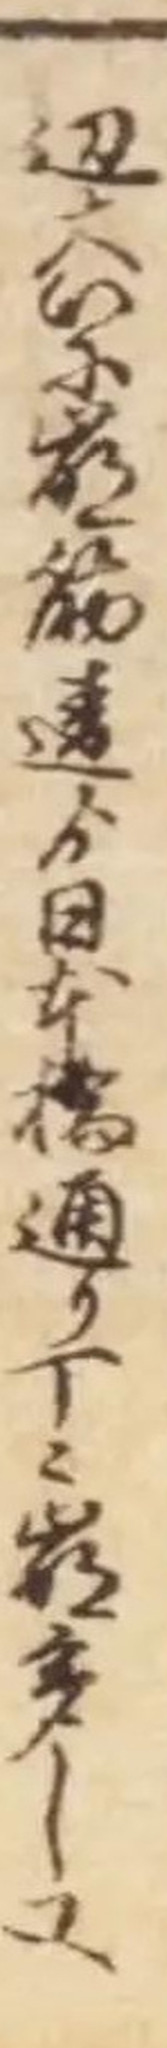辺大いに崩れ筋違より日本橋通り丁〻崩多し又
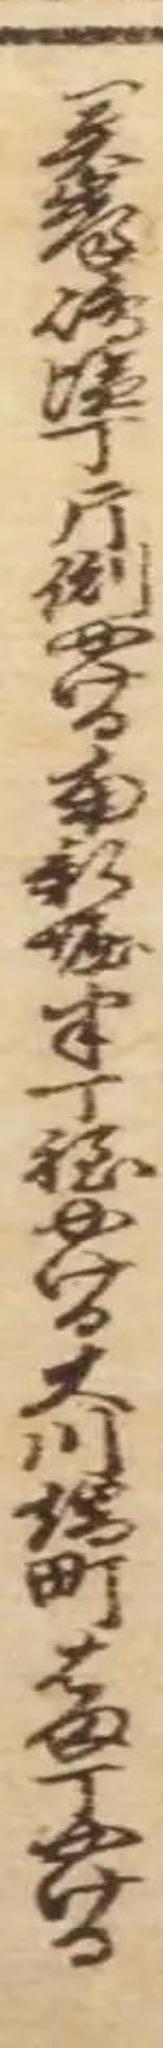霊岸島塩丁片側やける南新堀半丁程やける大川端町はま丁やける
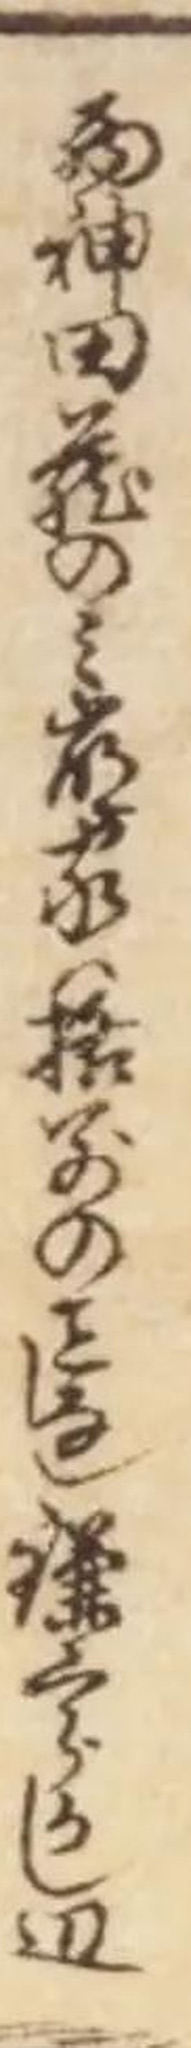西神田蔵のみ崩家は格別のことなし鎌くらかし辺
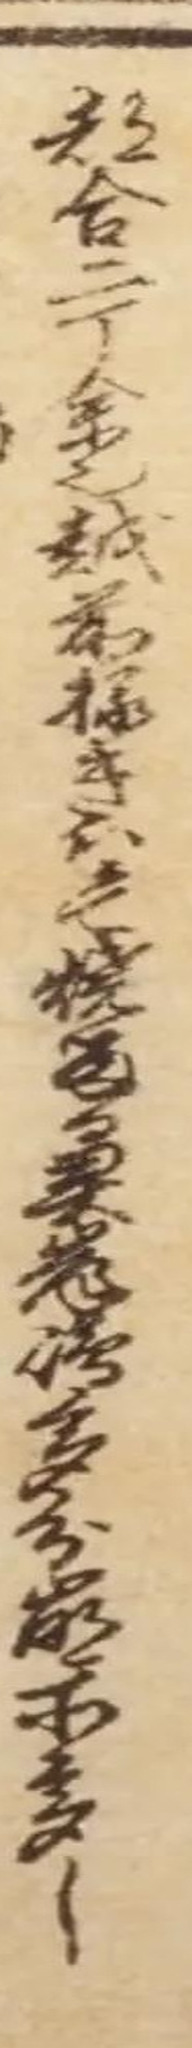都合二丁余也越前様きはにて焼留る霊岸島多分崩所多し
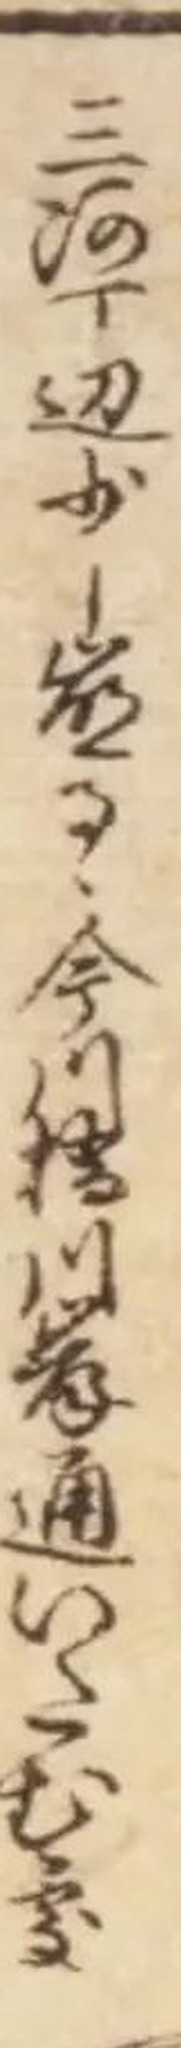三河丁辺少し崩るゝ今川橋川岸通いたむ處
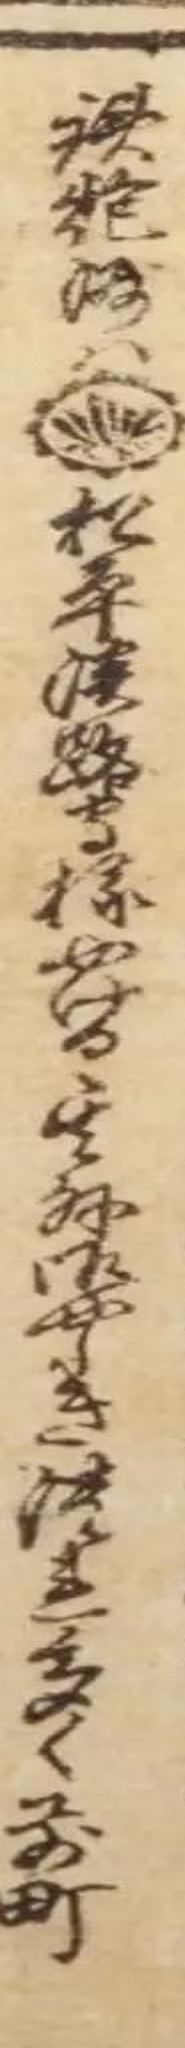鉄砲洲は〇松平淡路守様やける其外御やしき潰れ多く前町
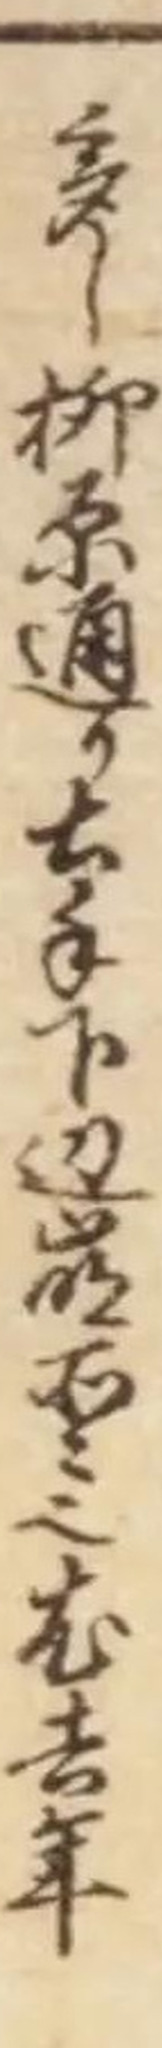多し柳原通り土手下辺崩所〻也尤去年
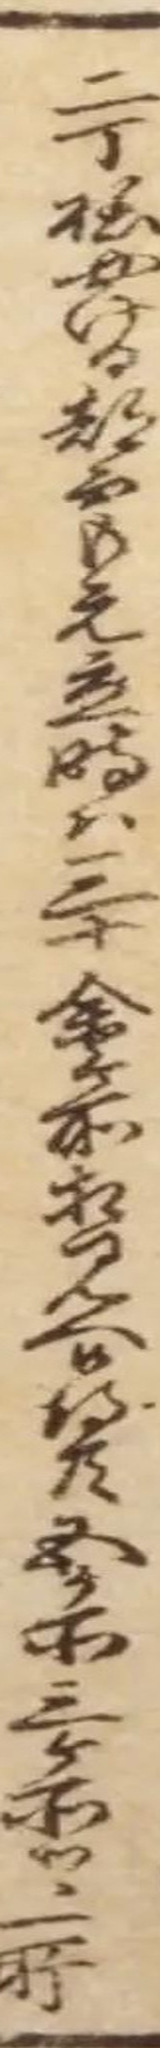二丁程やける都而もえ立時は三十余ケ所相見へ候得共五ヶ所三ヶ所ツヽ一所
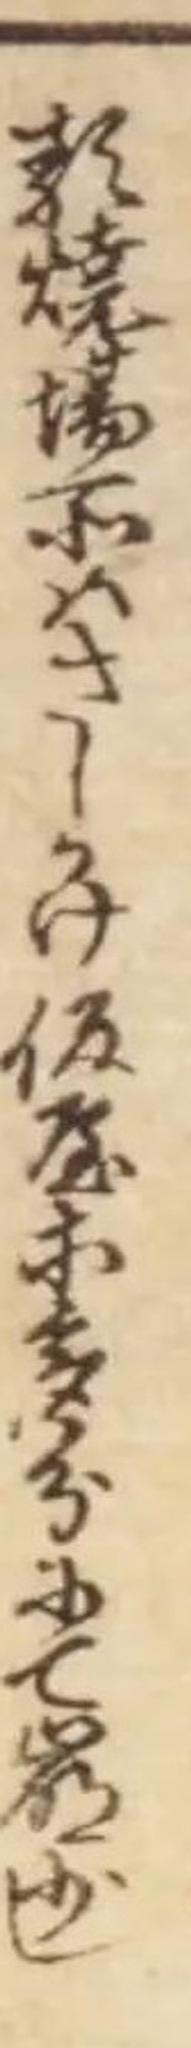類焼場所はさしかけ仮屋等多分にて崩少し
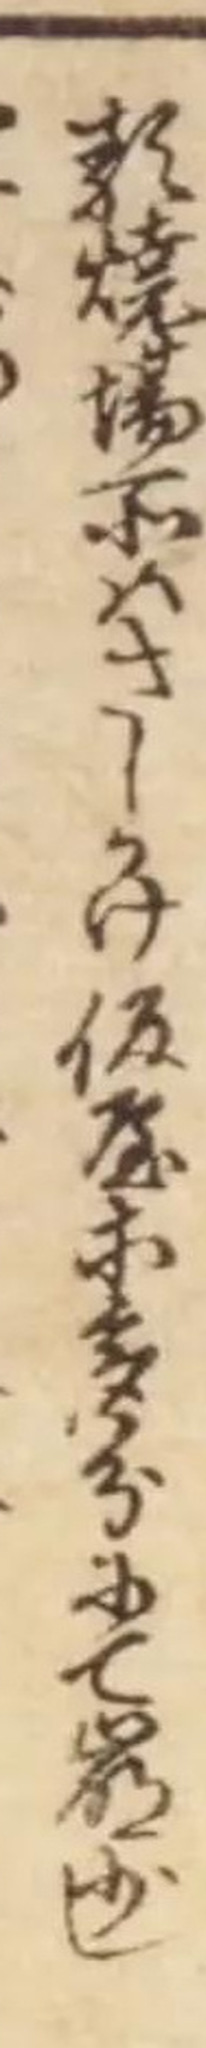類焼場所はさしかけ仮屋等多分にて崩少し
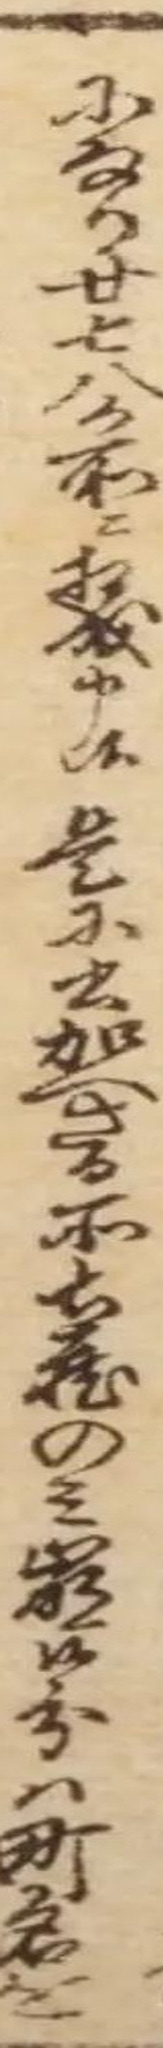になり廿七八か所に相成申候是に書加へさる所土蔵のみ崩候分は町名を
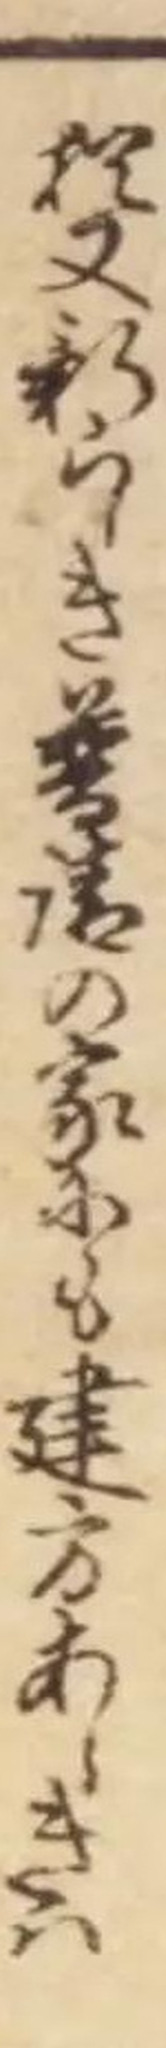猶又新しき普請の家にも建方あしきは
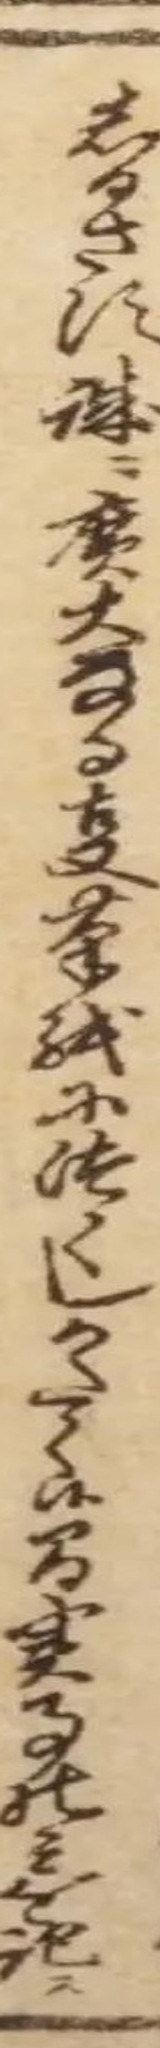しるさす誠に広大なる事筆紙につくしかたく候間実事のみを記ス
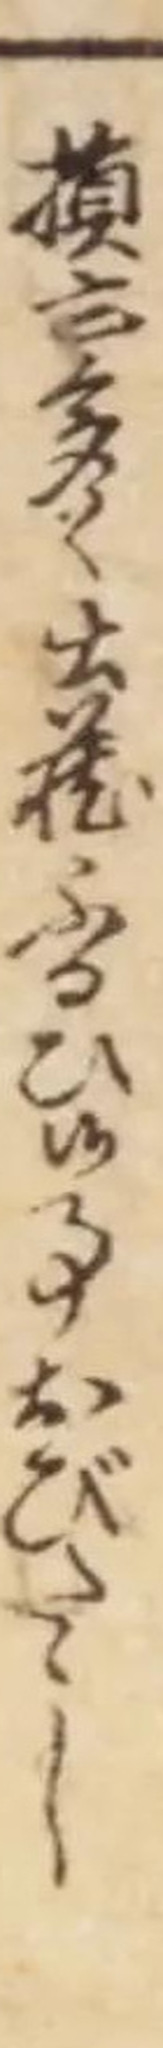損亡多く土蔵ふるひ候事おびたゞしく
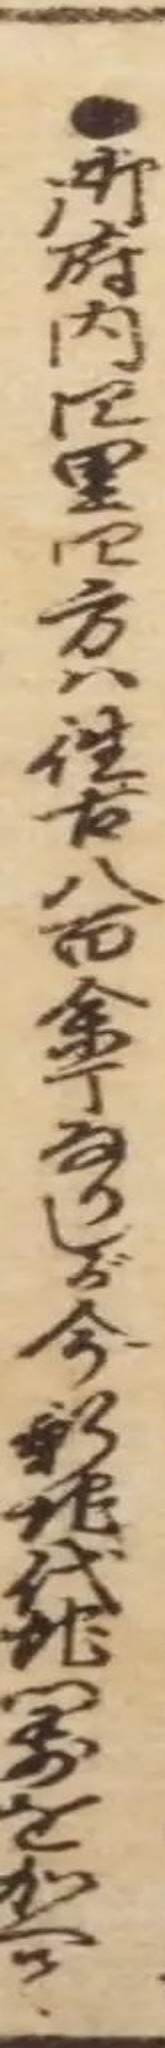●御府内四里四方は往古八百余丁なりしが今新地代地門前を加へて
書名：御江戸関八州大地震出火巨細記
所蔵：国立国会図書館 National Diet Library, JAPAN
